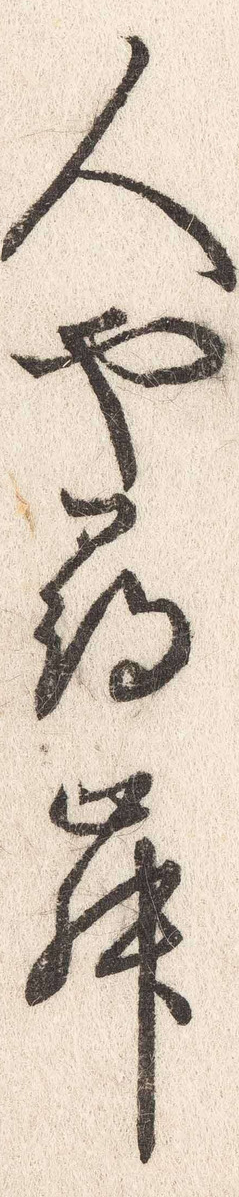人や尋む

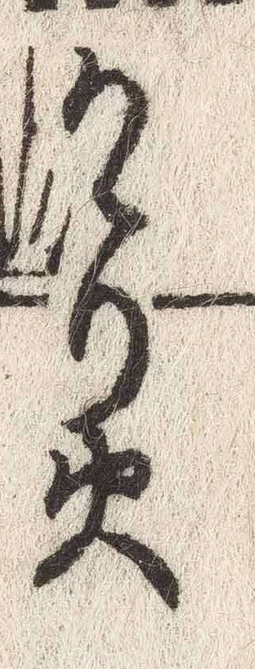かゝり火

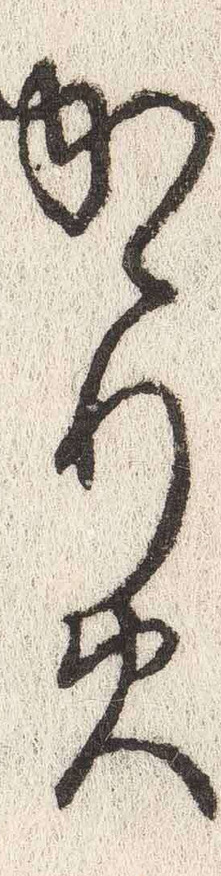かゝり火
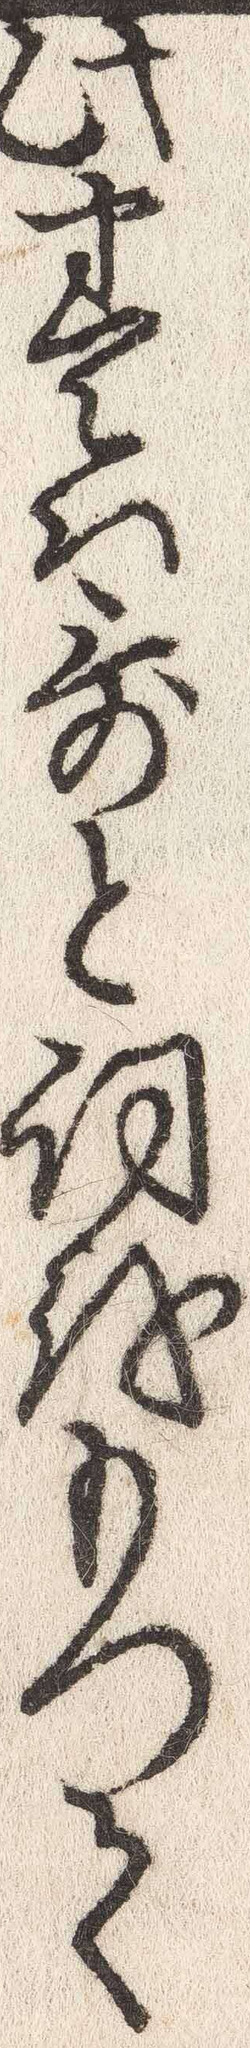此巻は哥と詞をもつて
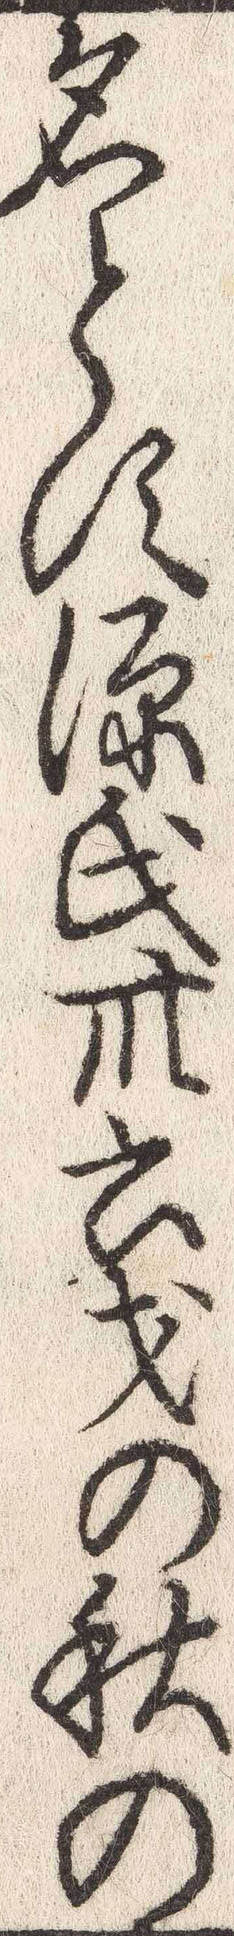名とす源氏卅六才の秋の
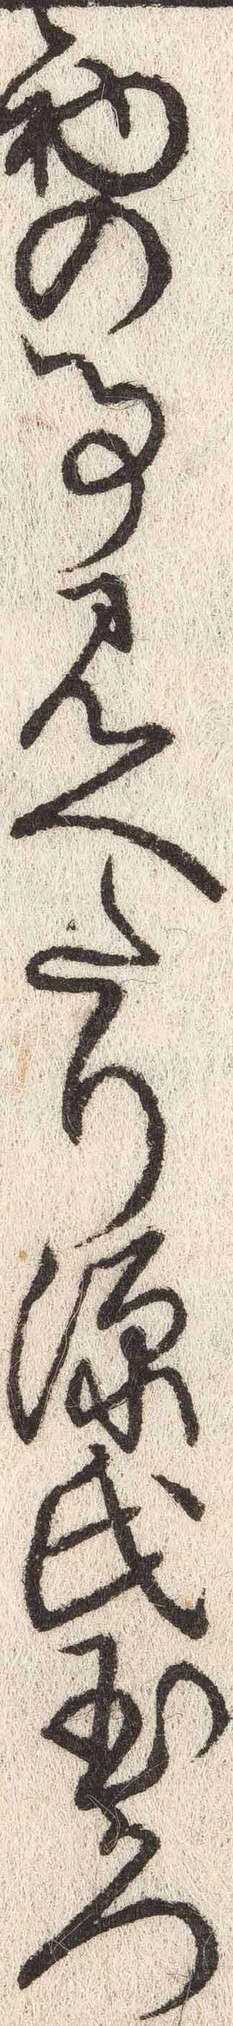初の事見へたり源氏玉かつ
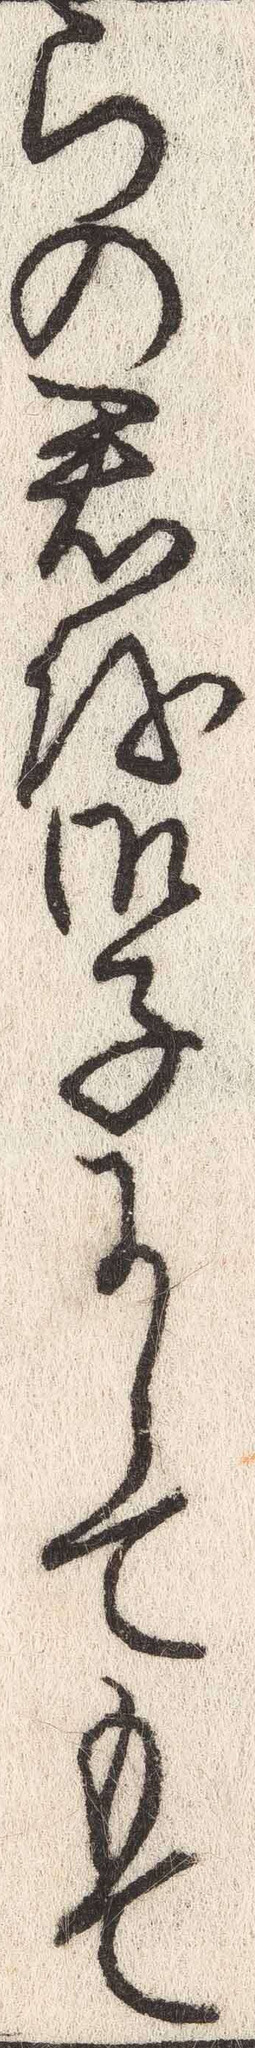らの君を御子にしてもて
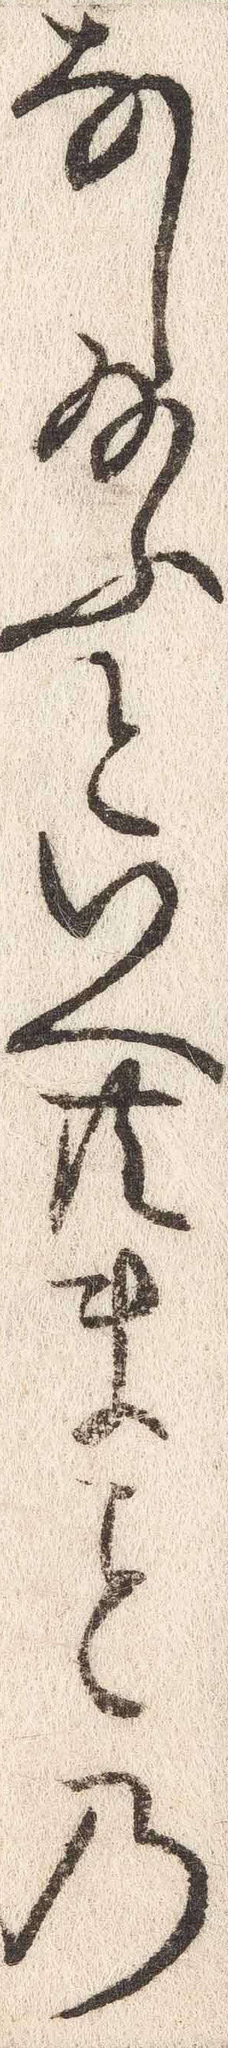なし給ふといへ共まことの
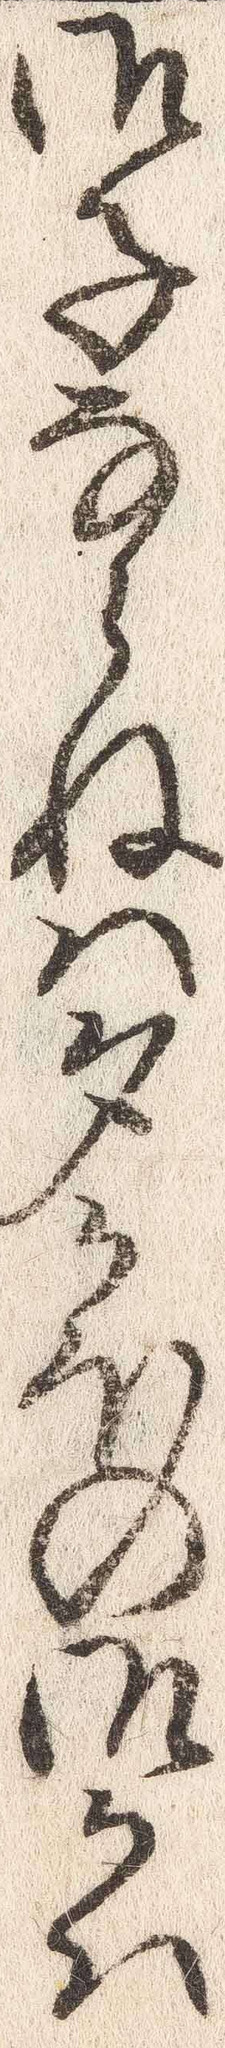御子ならねは夕かほの御かは
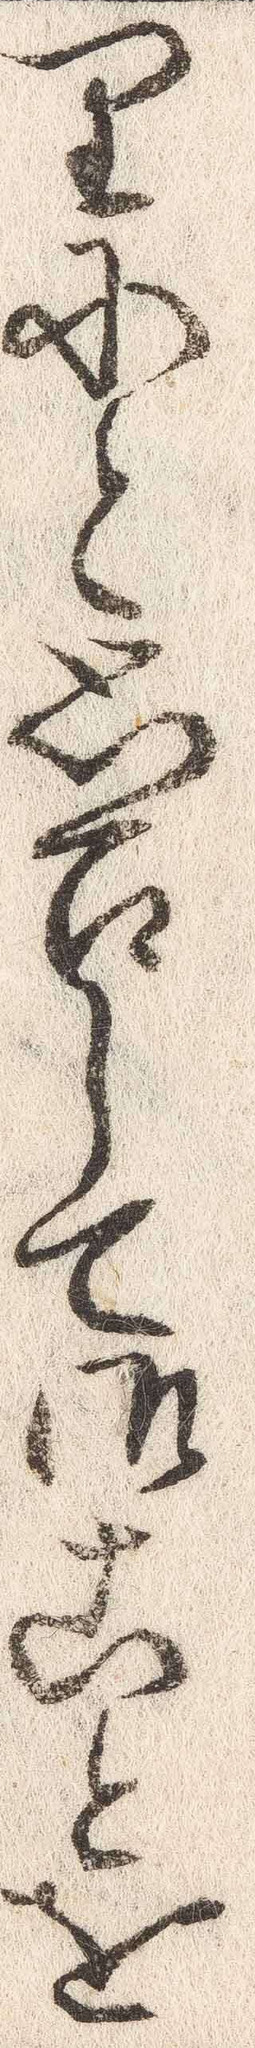りにと思召して御ことを
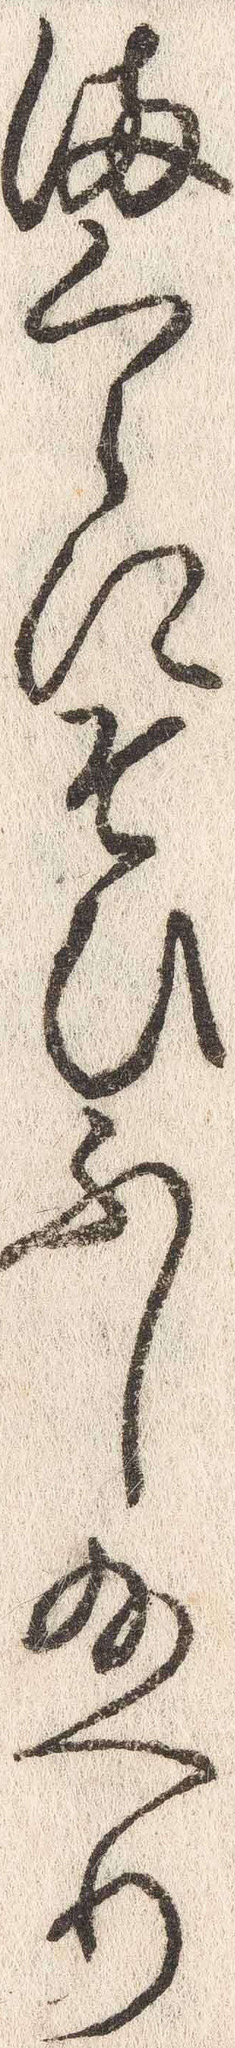まくらにそひふし給へり
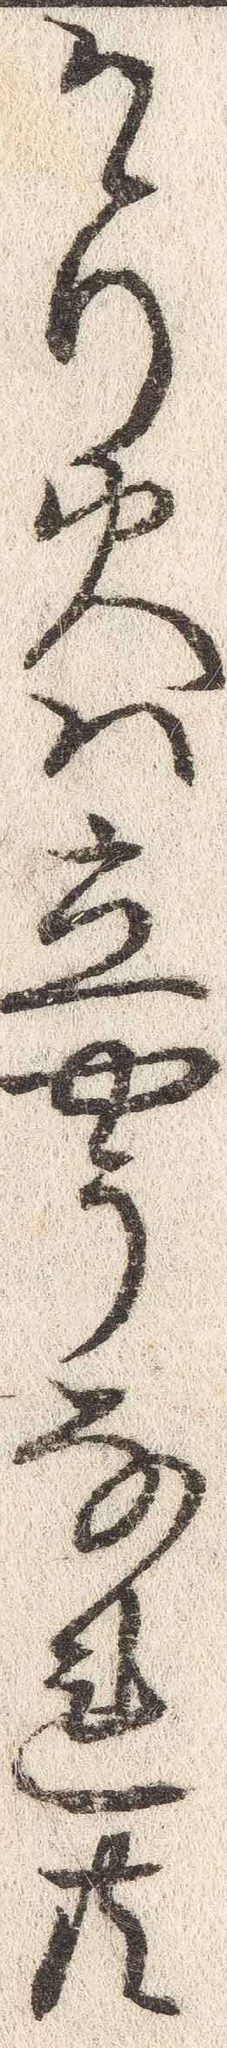かゝり火は立やうなれ共

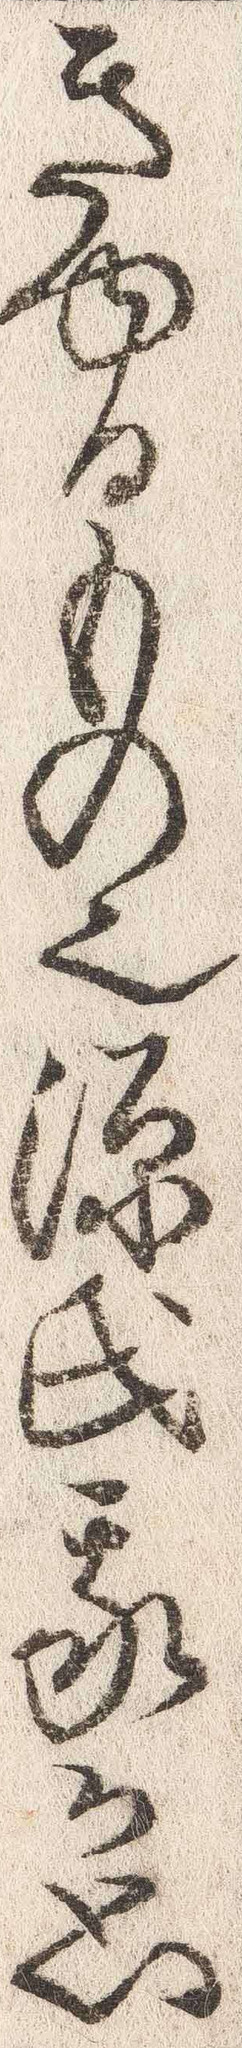きゆるもの也源氏我か思
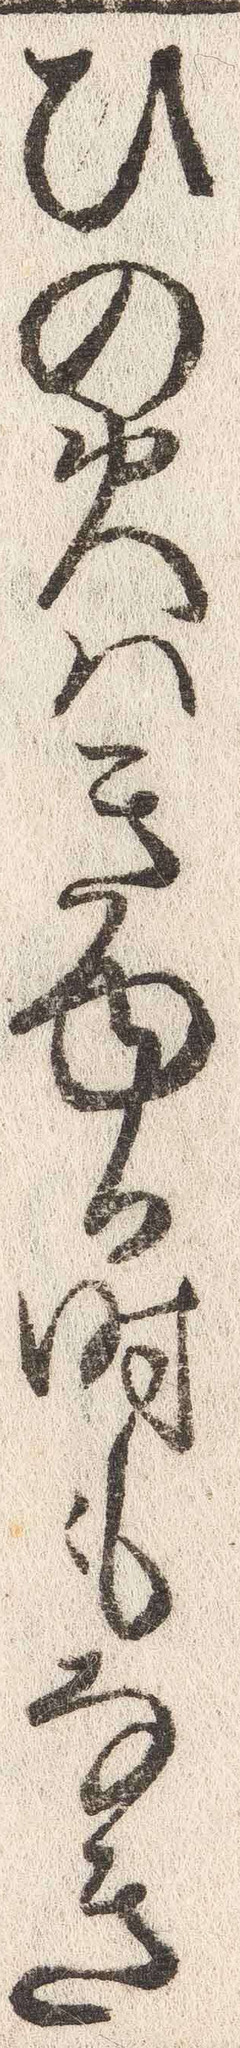ひの火はきゆる時もなき
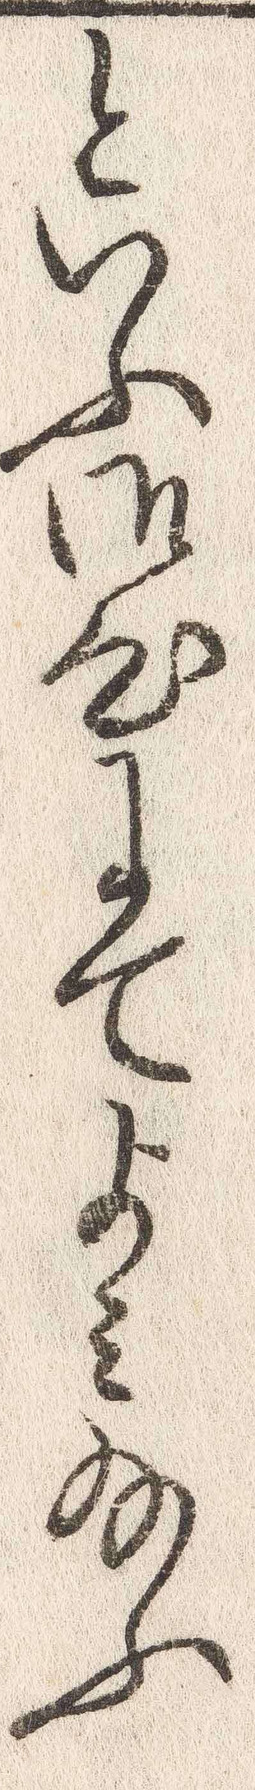といふ御心にてよみ給ふ
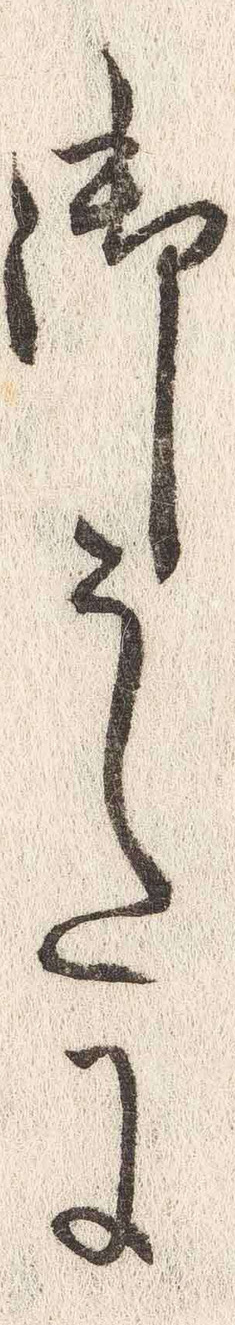御うたに
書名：源氏物語
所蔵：東京学芸大学附属図書館 国文学研究資料館
